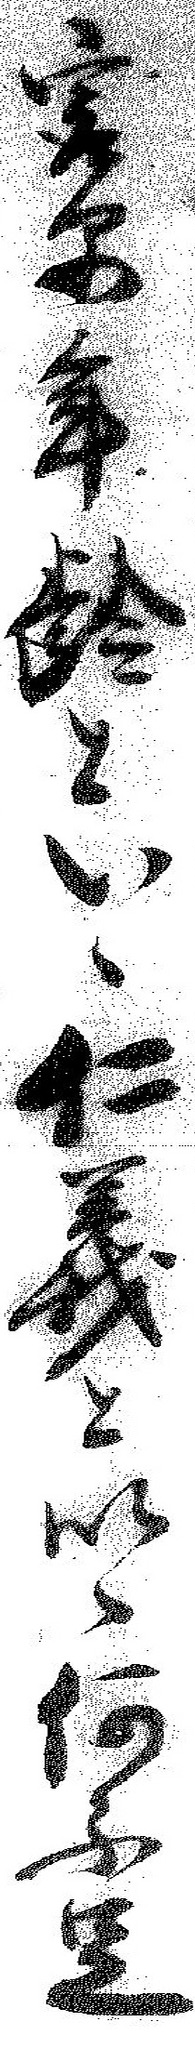最早年齢といゝ仁義といゝ何不足
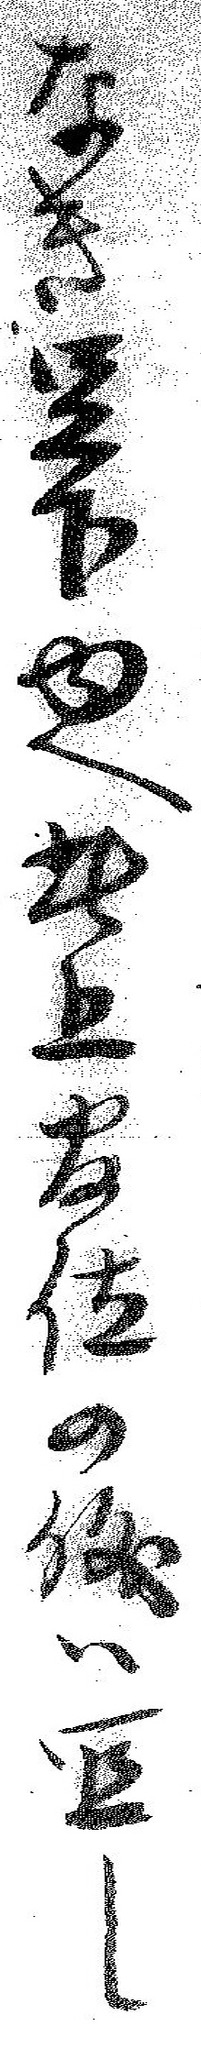なき足下ゆへ此上官位の儀は宜し
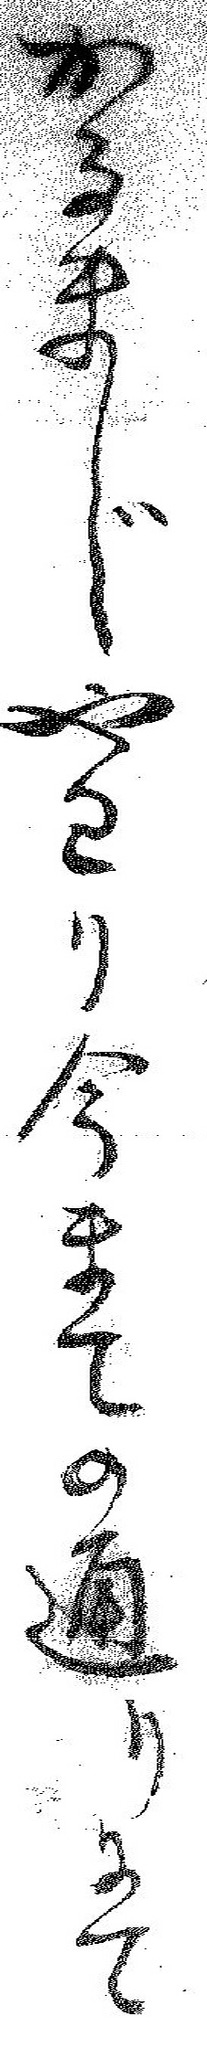かるまじやわり今まての通りにて
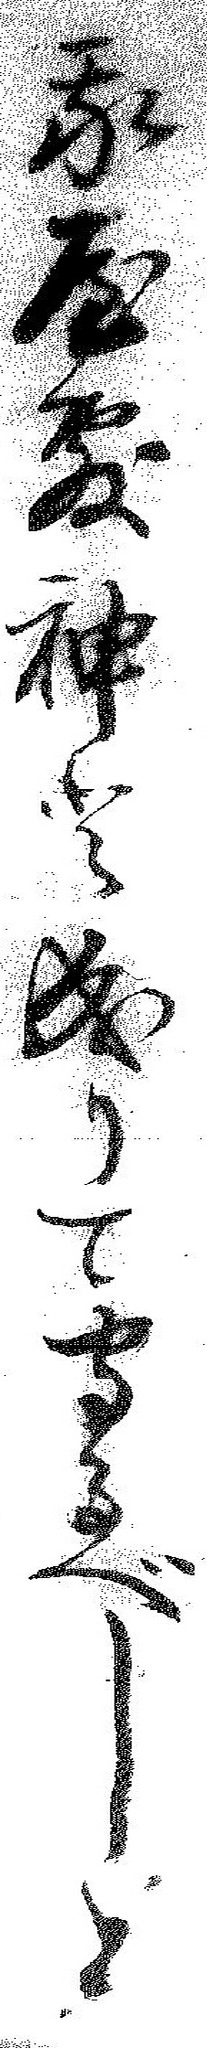我屋敷神と成りて守るべしと
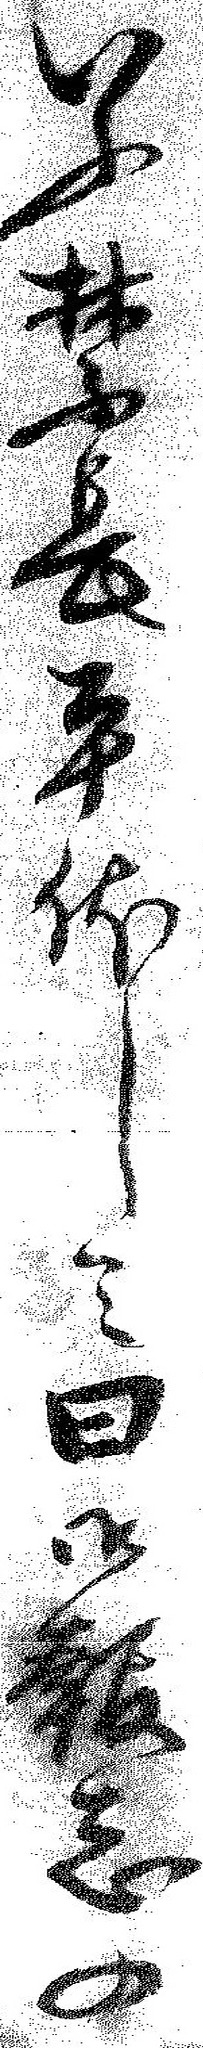いふ禁長平伏して曰御報志の
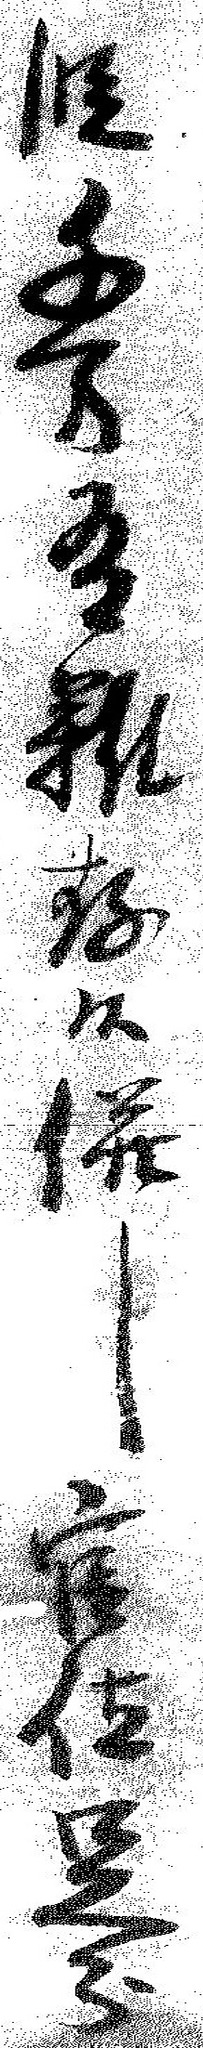段千万有難存候併し官位足ら
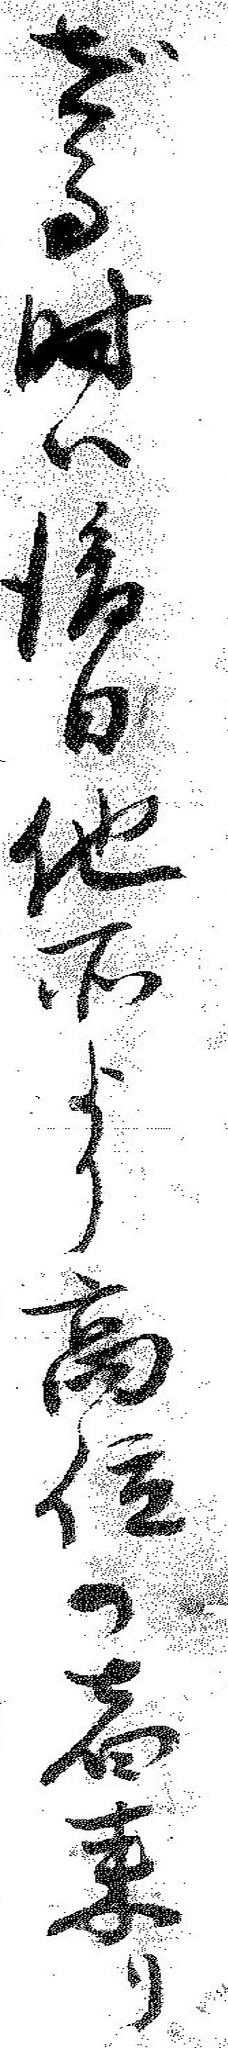ざる時は後日他所より高位の者来り
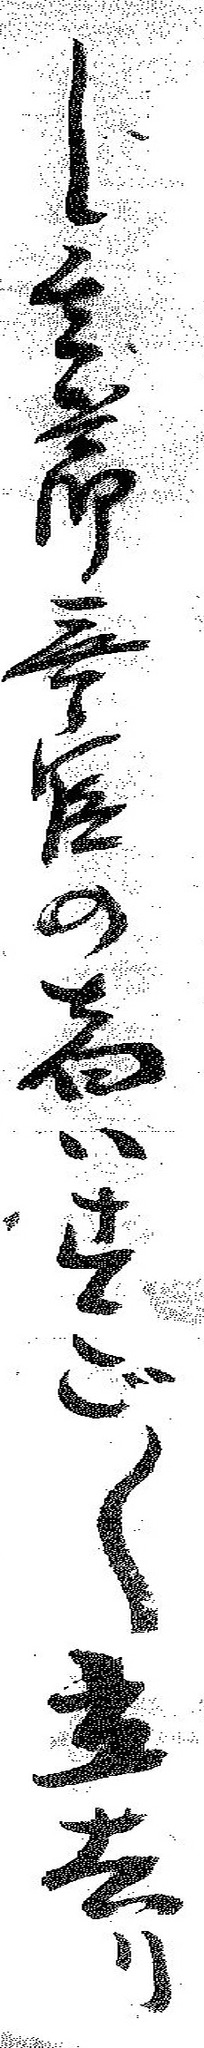し其節無官の者はすご〳〵立去り
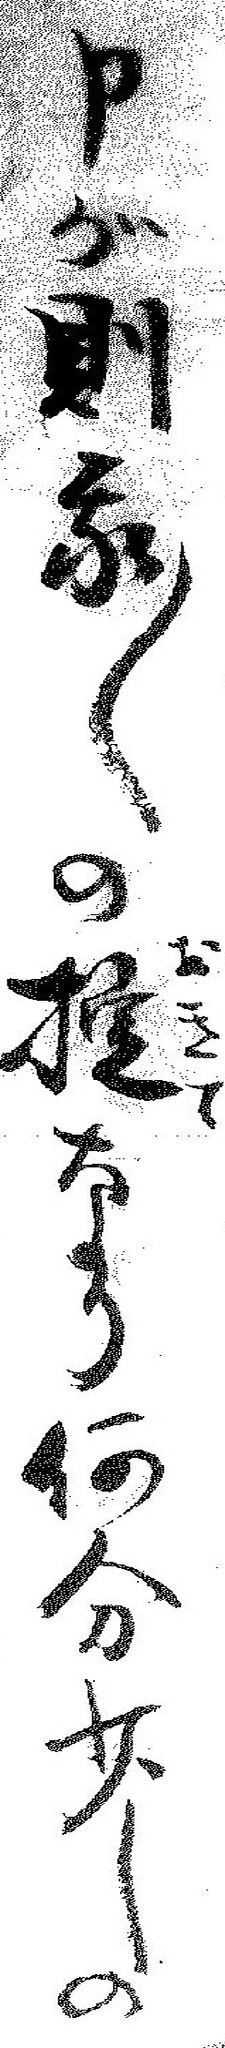申が則我〳〵の掟なり何分少しの
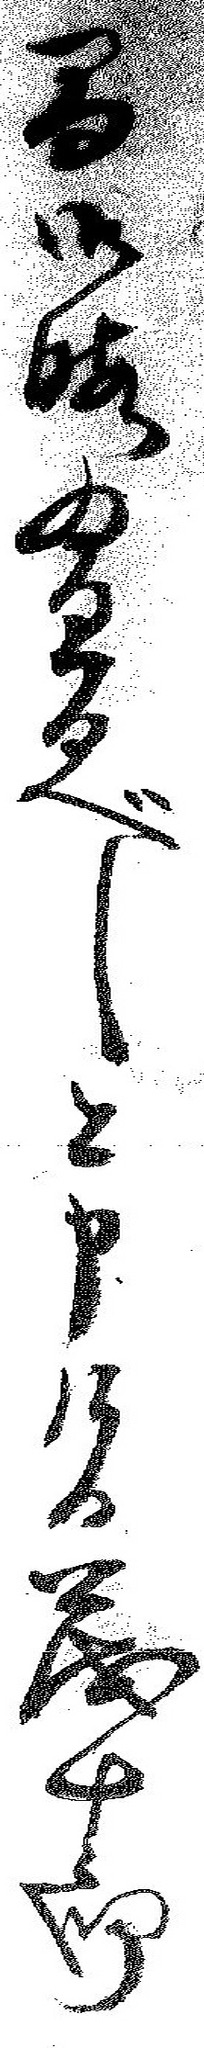間御暇給わるべしと申ける茂十郎
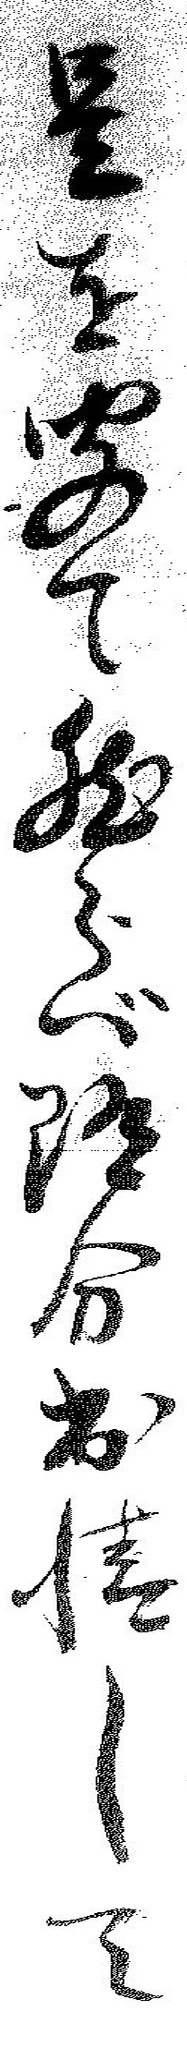是を聞て然らば随分出精して
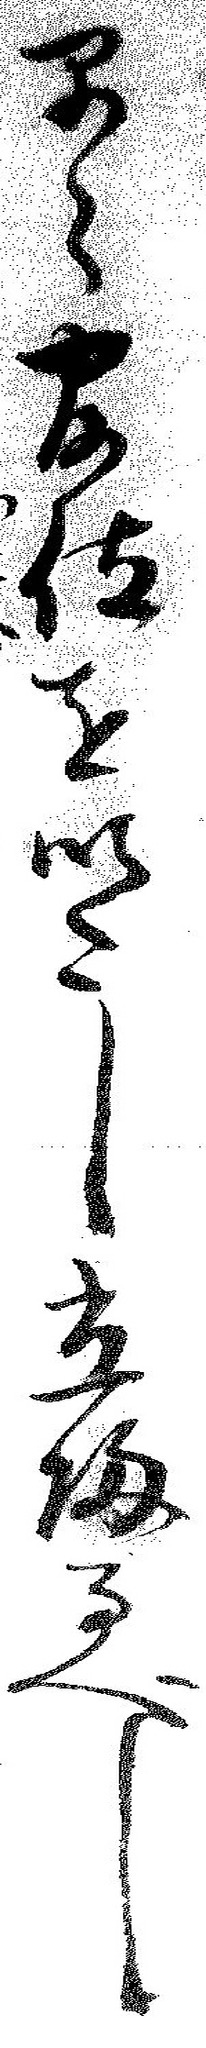早く官位をいたし立帰るべし
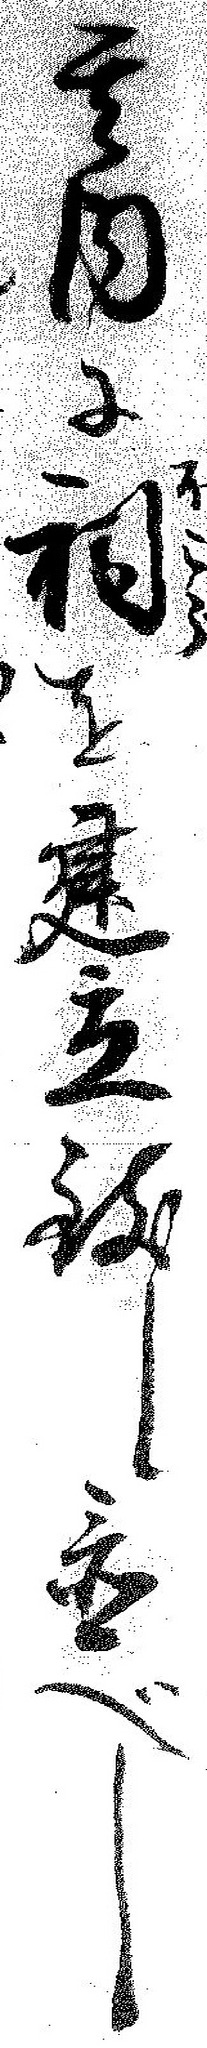其内に祠を建立致し置べし
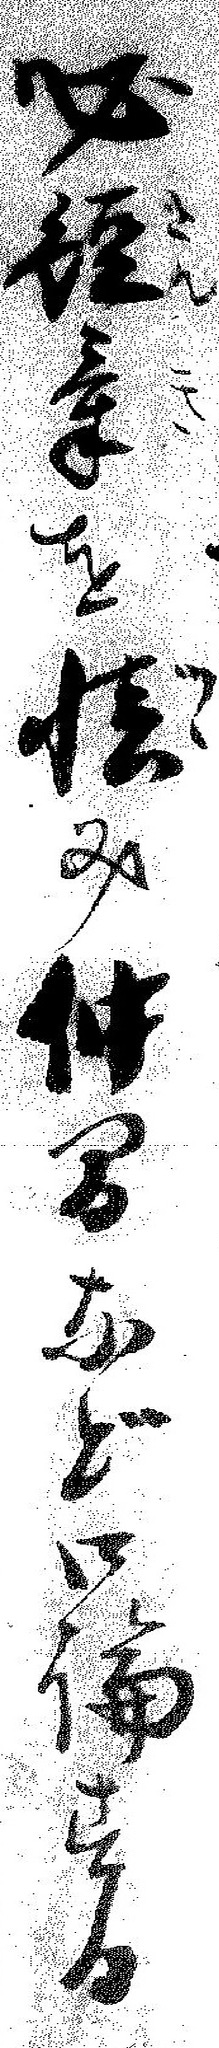必短気を慎み仲間など口論する
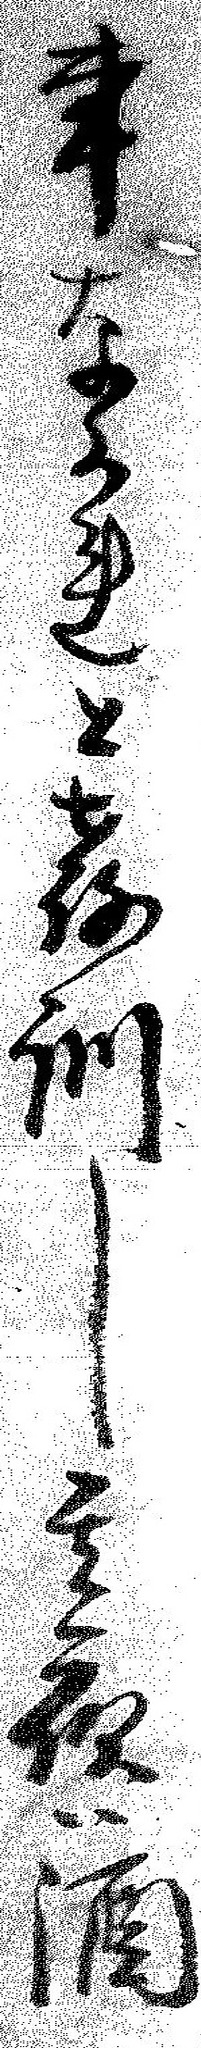事なかれと教訓し其夜は酒

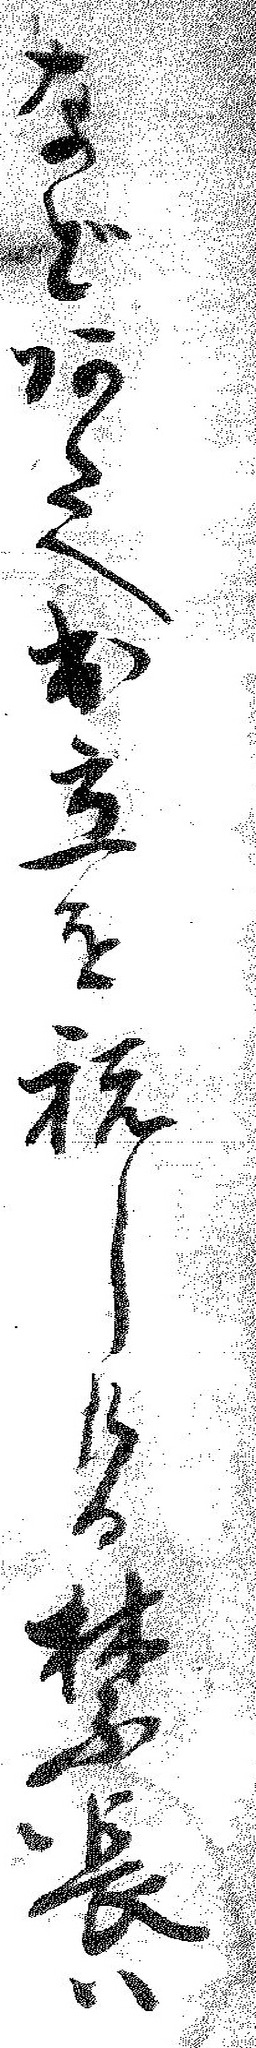などあたへ出立を祝しける禁長は
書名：近頃古狸珍説　礼義智信
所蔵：徳島県立図書館
